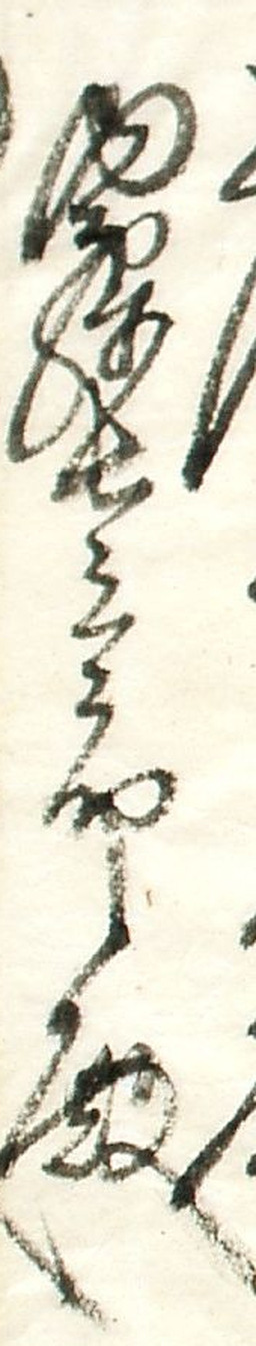内藤長三郎殿
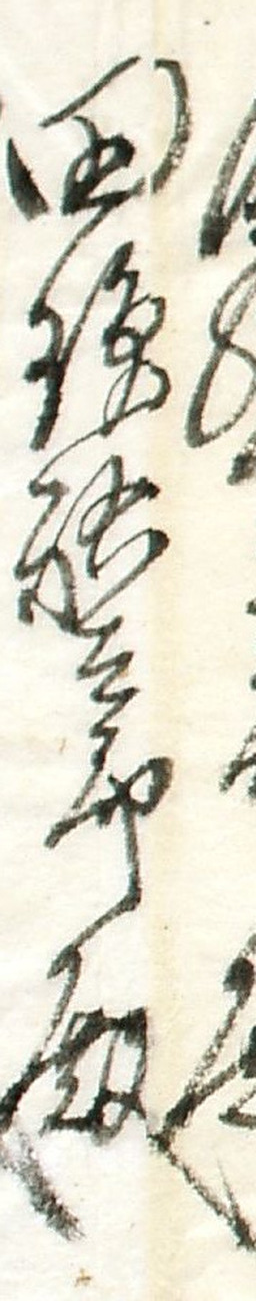田野祐太郎殿
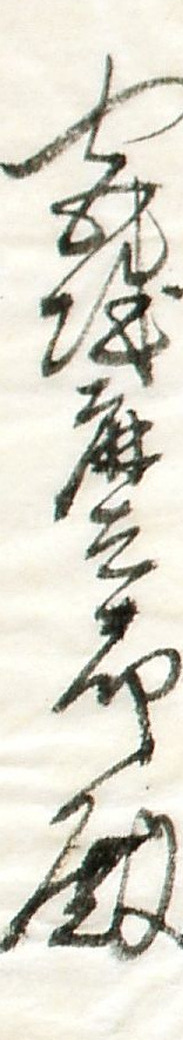宮城麻太郎殿

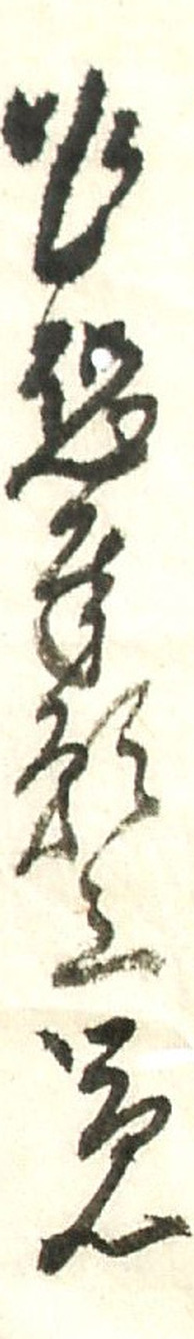乍恐奉願上覚
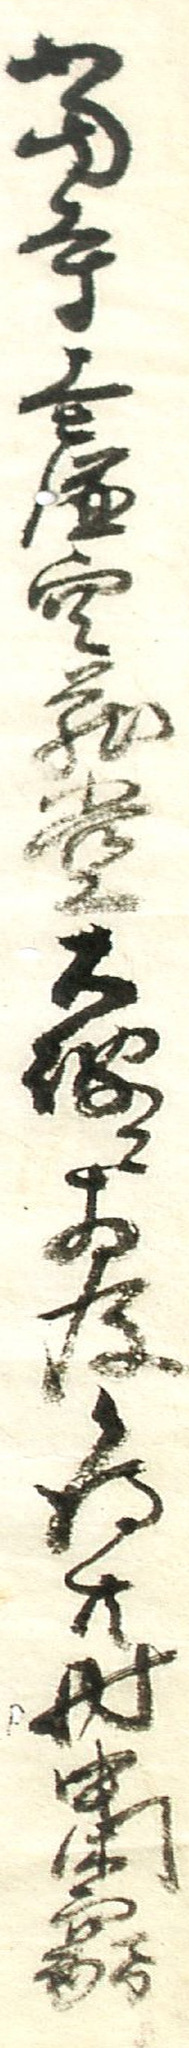當寺虚空蔵堂大破ニ相及候得共村中困窮
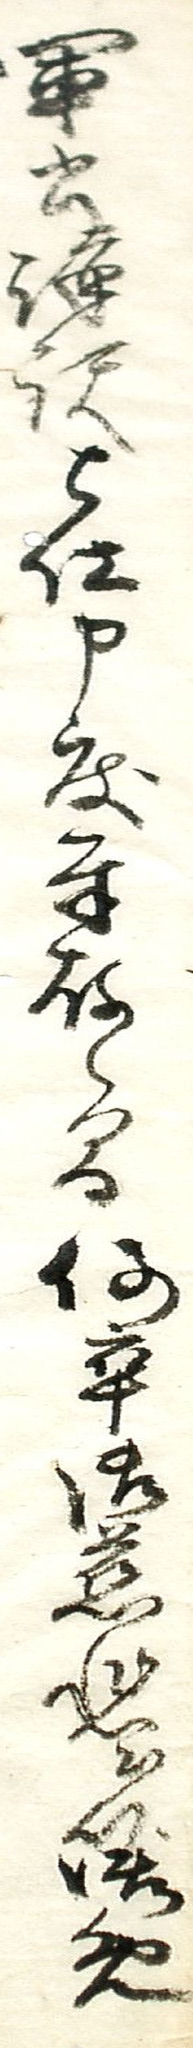軍書講釈を仕申度奉存候間何卒御慈悲ヲ以御免
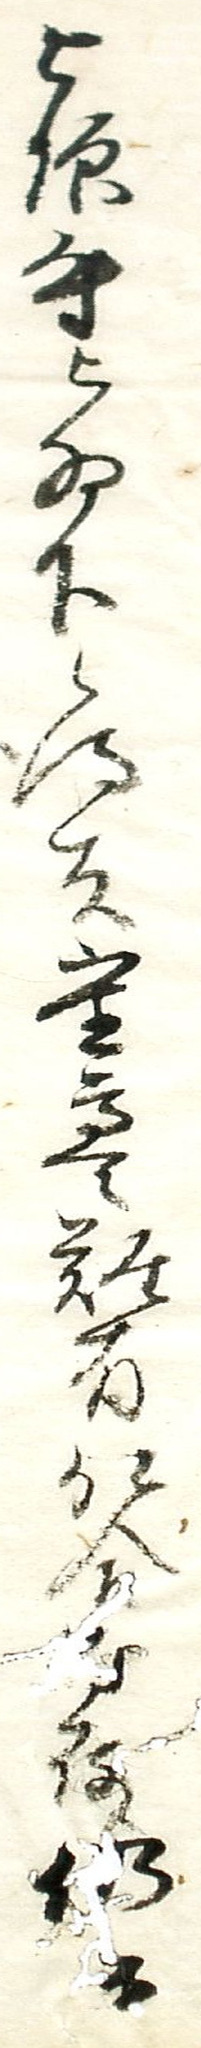被仰付被為下候得者重畳難有仕合奉存候仍而
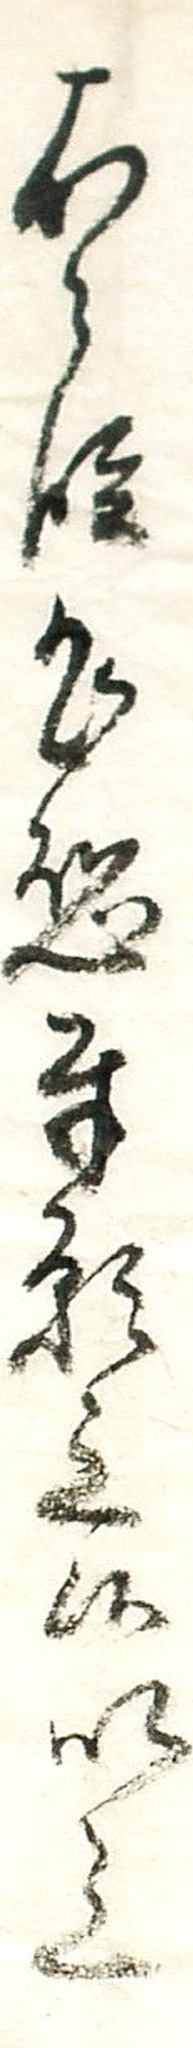右之段乍恐奉願上候以上
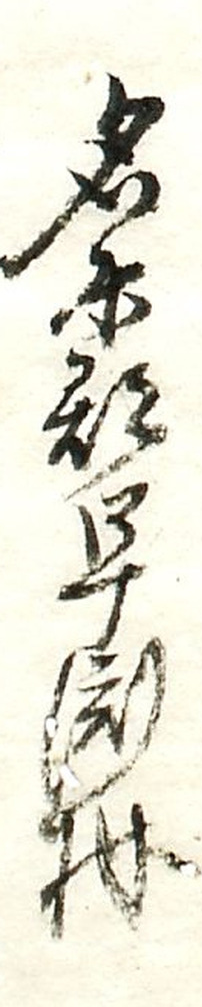名東郡早渕村
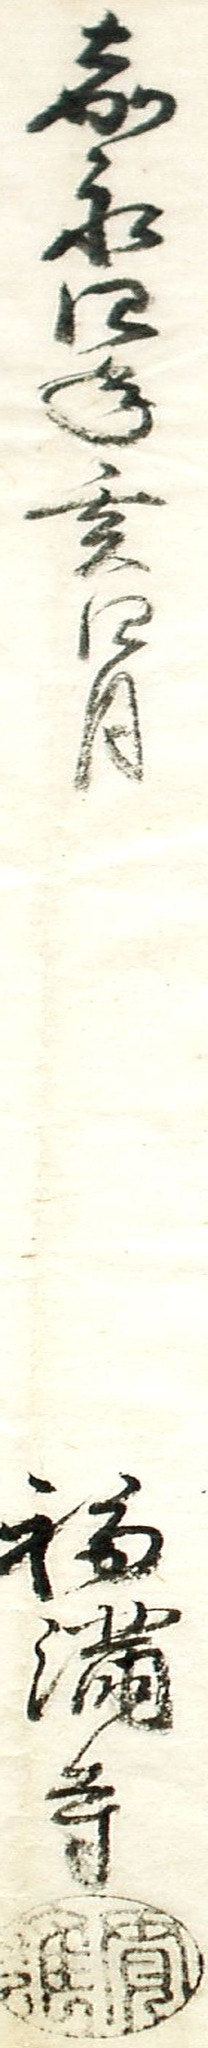嘉永四年亥四月福満寺
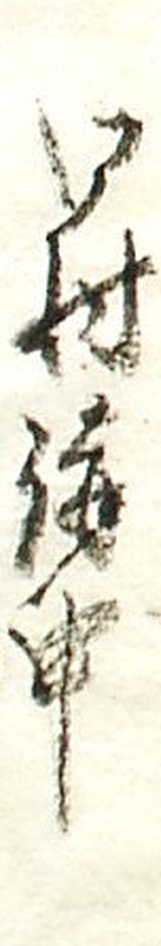同村講中
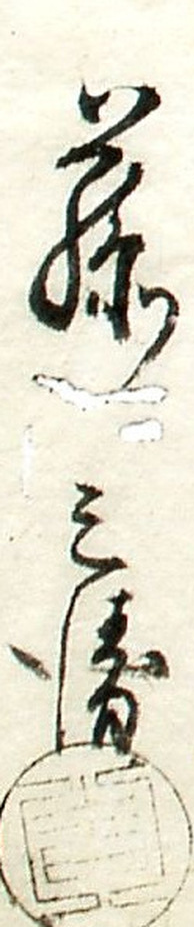藤兵衛
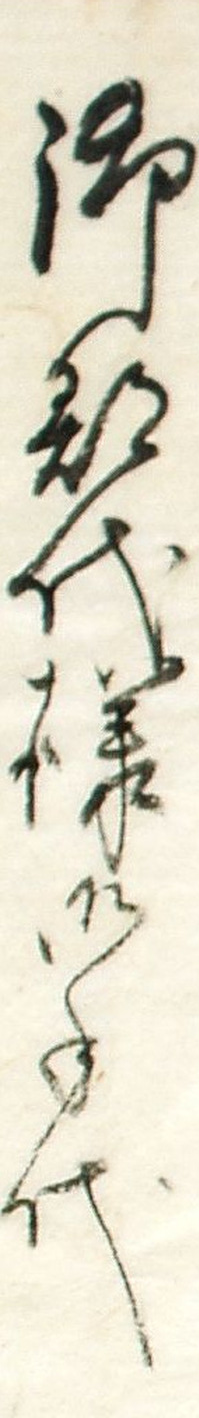御郡代様御手代
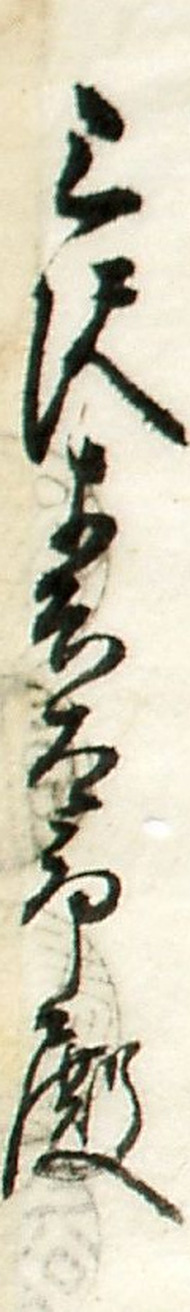三澤春太郎殿
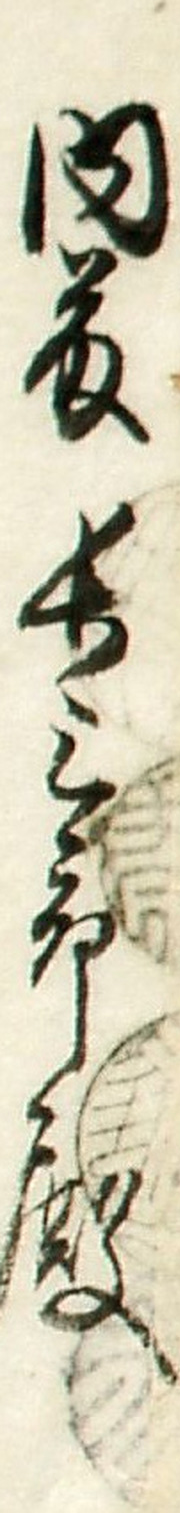内藤長三郎殿
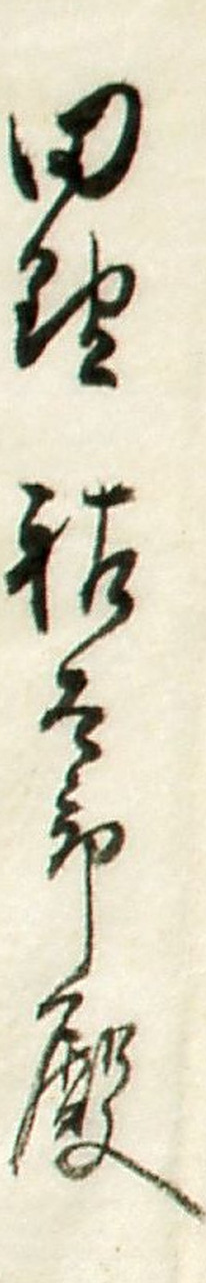田野祐太郎殿
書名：(早渕村福満寺子ども浄瑠璃願紙面）他
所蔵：鳴門教育大学 Naruto University of Education
